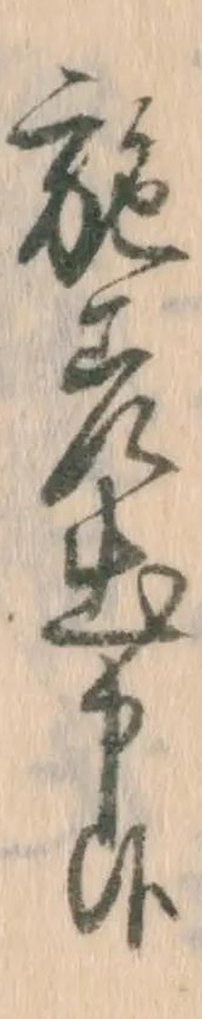施差出申候
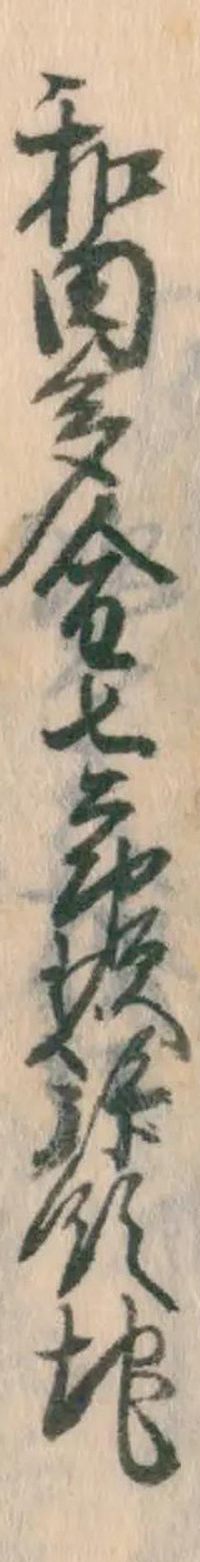和田多金七郎様拝領地
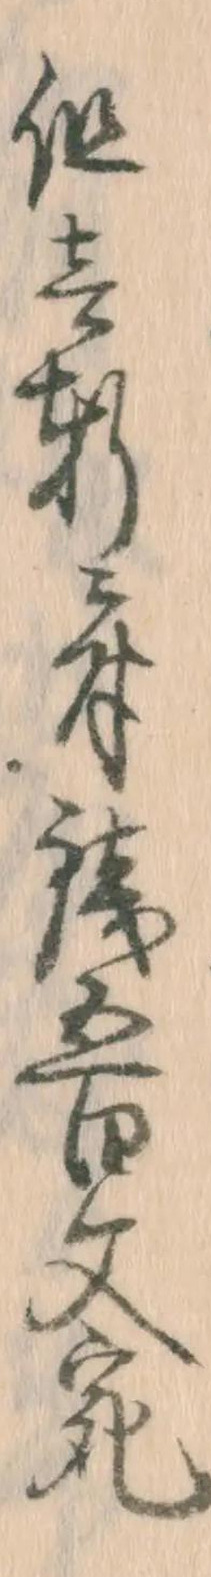但壱軒ニ付銭五百文宛
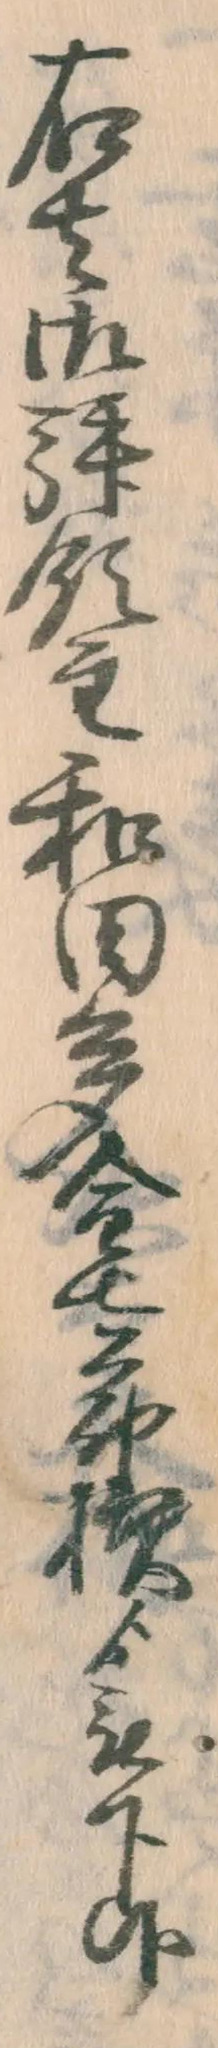右は御拝領主和田多金七郎様ゟ被下候
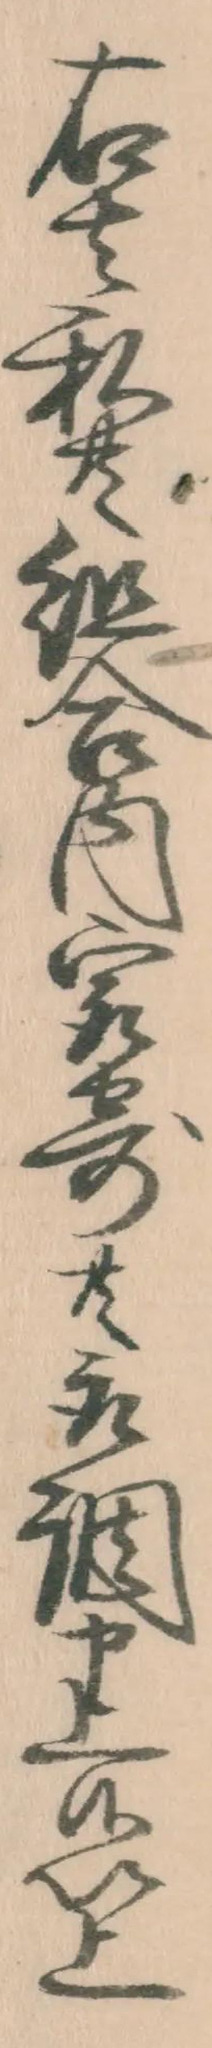右は私共組合内最寄共取調申上候以上
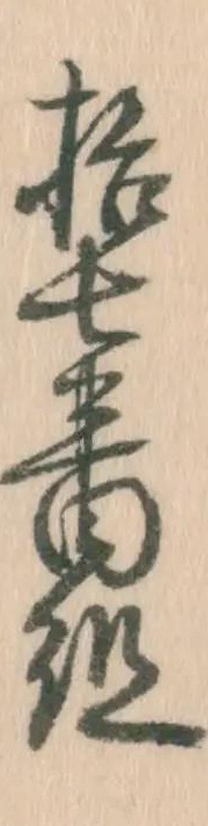拾七番組
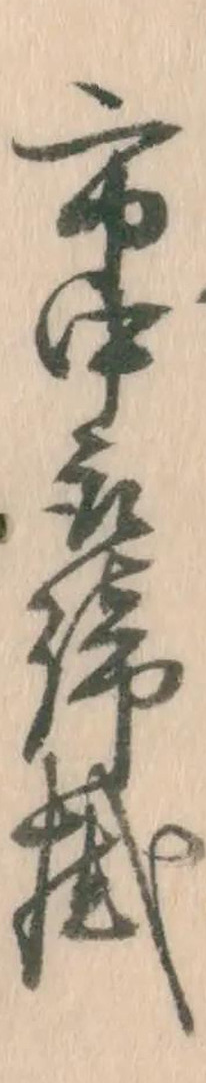市中取締掛

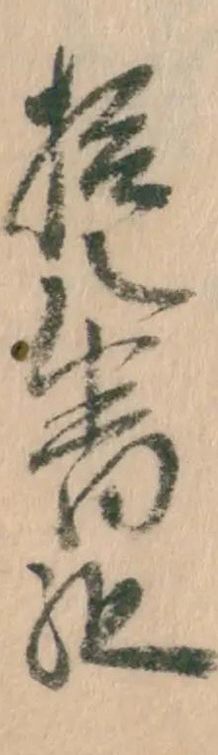拾八番組

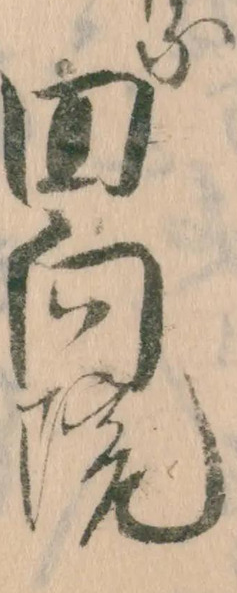回向院
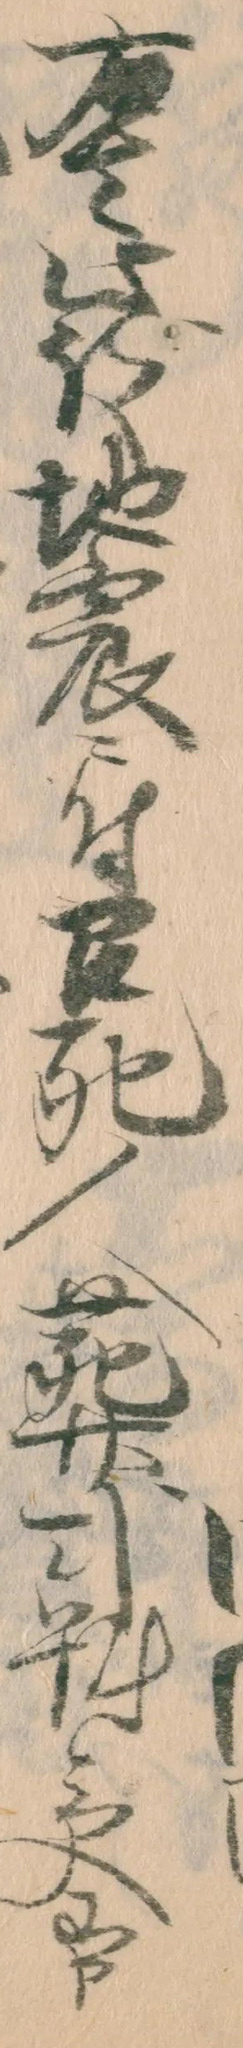右は此度地震ニ付即死人葬式料受取不申
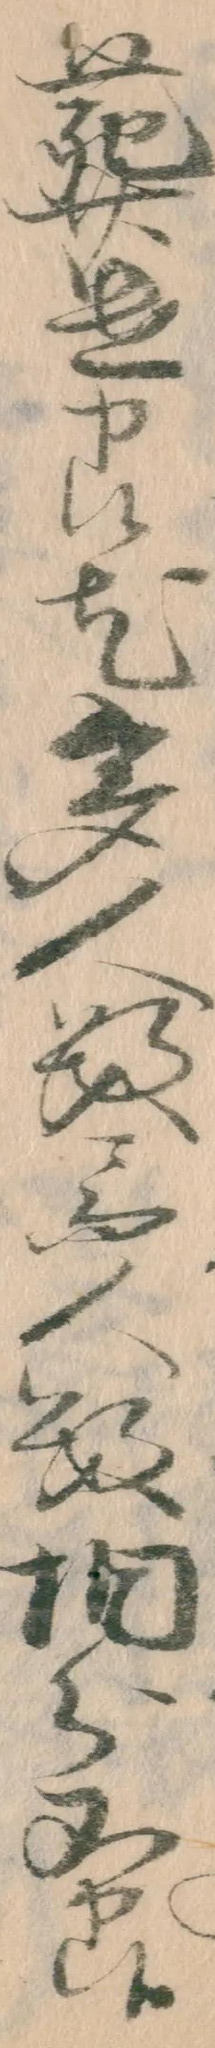葬遣申候尤多人数ニ而人数相分不申候
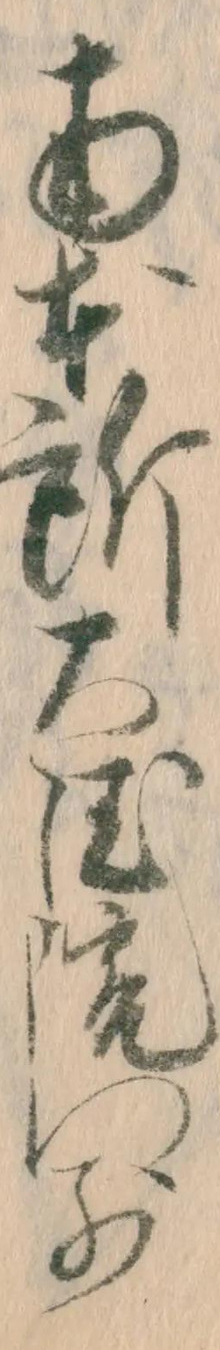南本所大徳院門前
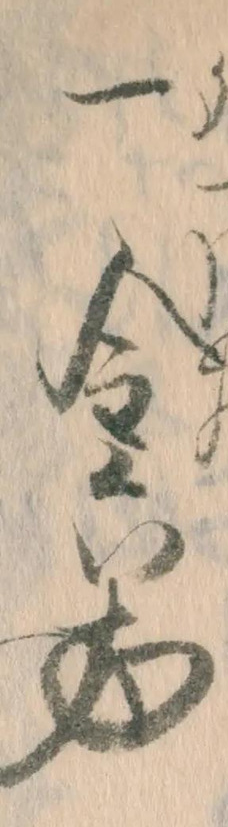一金六両
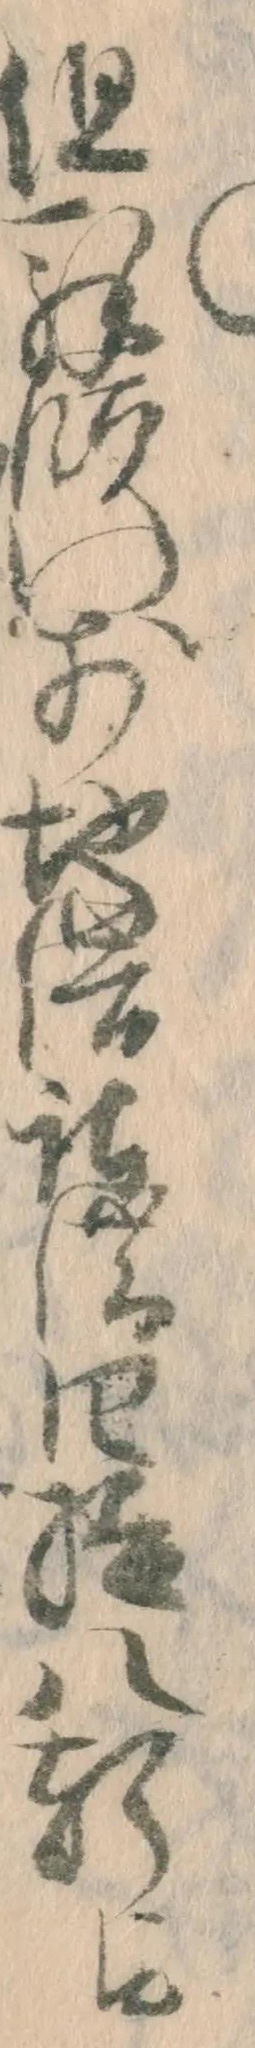但拝領門前地借店借四拾八軒え
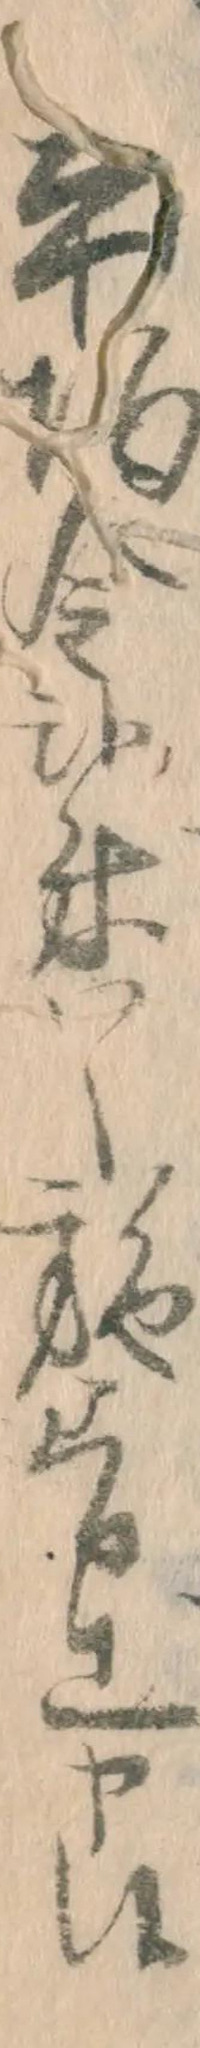平均金弐朱ツヽ施差出申候

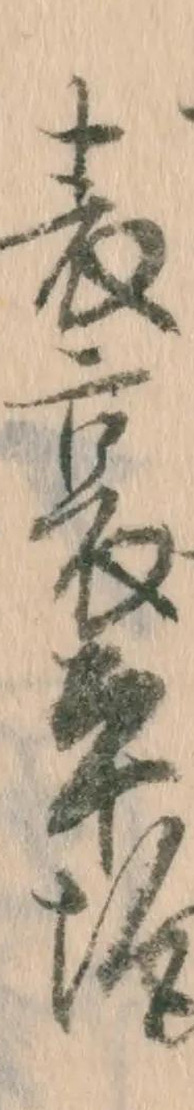表裏平均
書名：武家方并寺院等ニテ施差出候一件
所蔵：国立国会図書館 National Diet Library, JAPAN
